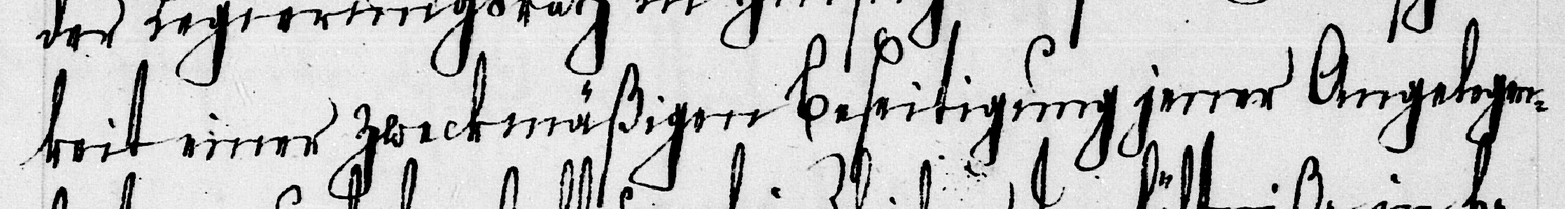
keit einer zweckmäßigen Beseitigung jener Angelegen¬
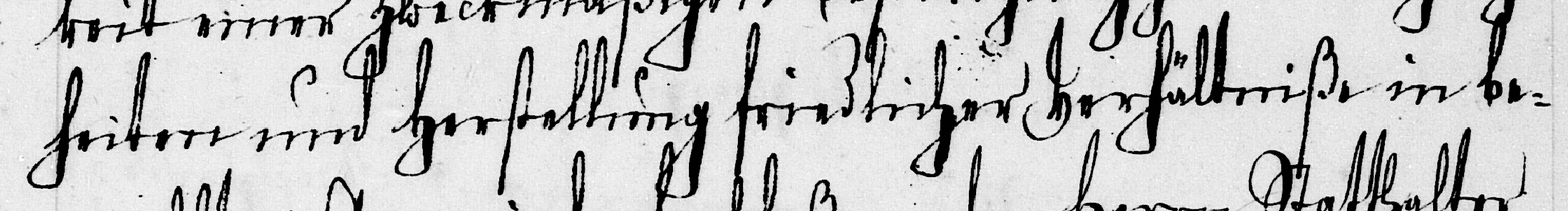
heiten und Herstellung friedlicher Verhältniße in be¬
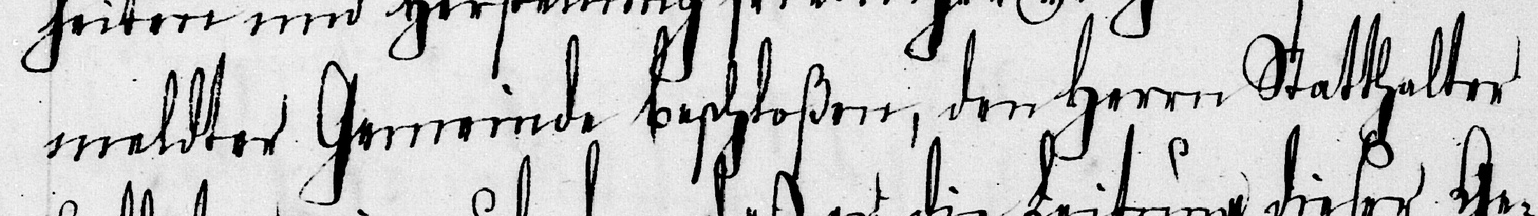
meldter Gemeinde beschloßen, den Herrn Statthalter
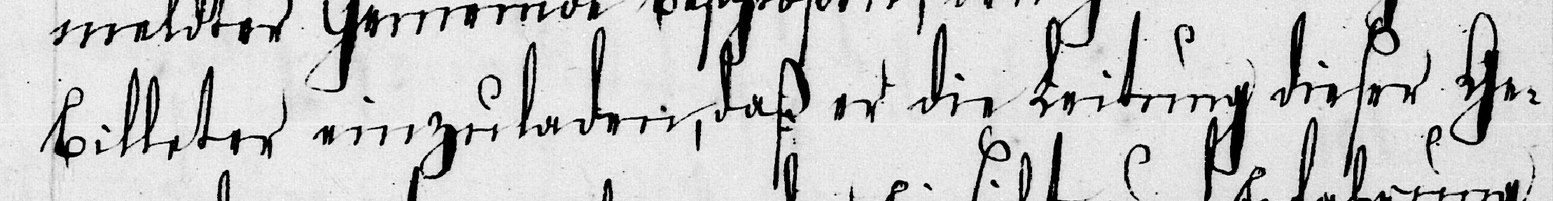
Billeter einzuladen, daß er die Leitung dieser Ge¬
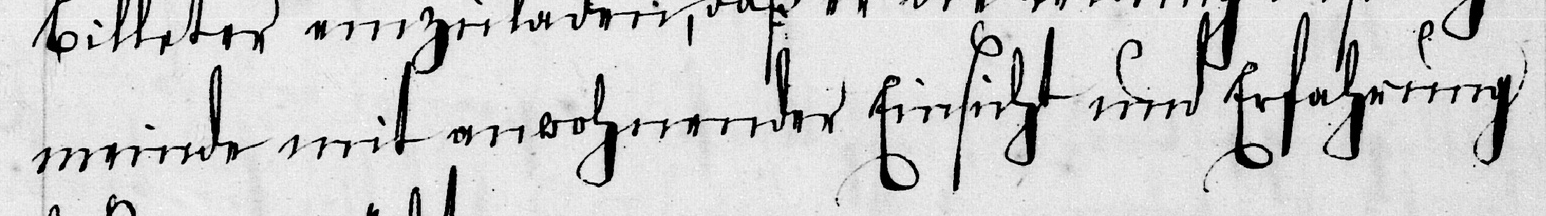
meinde mit anwohnender Einsicht und Erfahrung
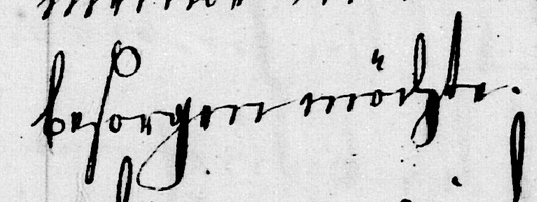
besorgen möchte.
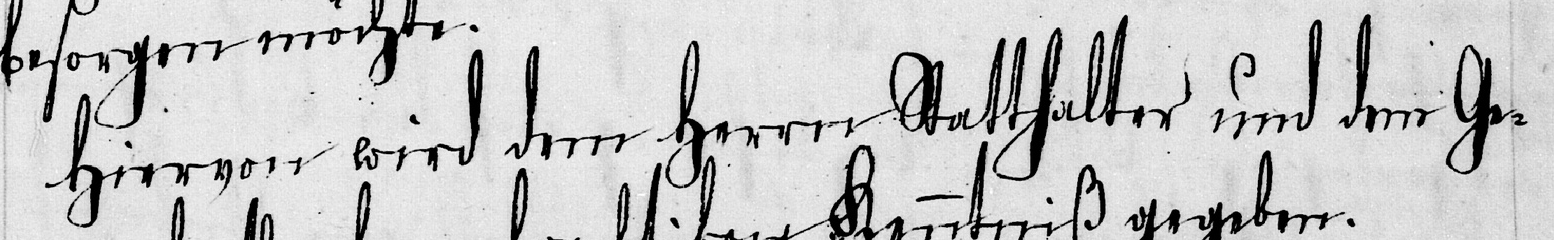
Hiervon wird dem Herrn Statthalter und dem Ge¬
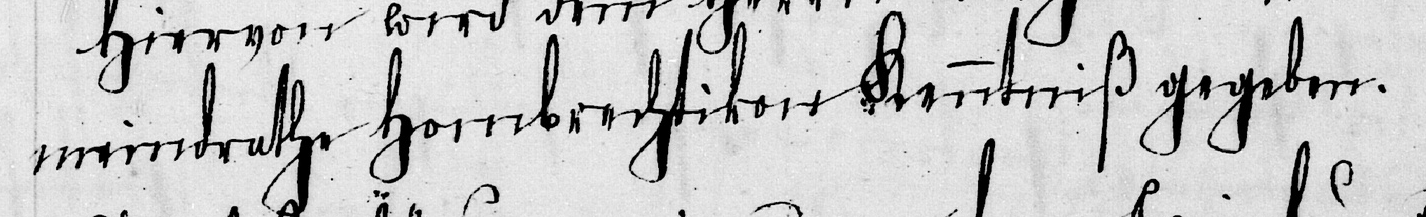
meindrathe Hombrechtikon Kenntniß gegeben.
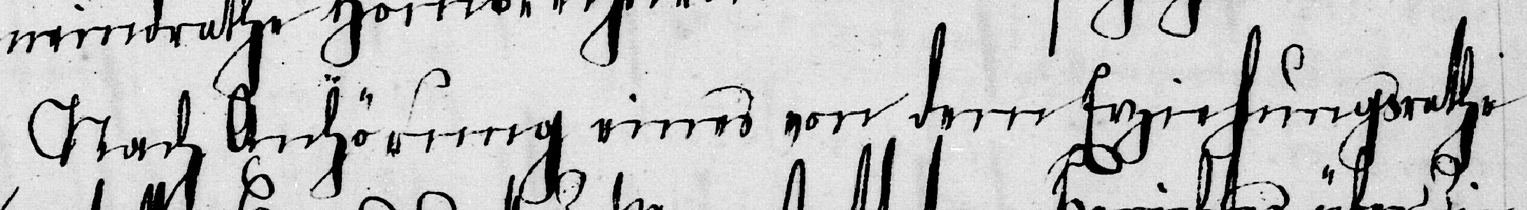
Nach Anhörung eines von dem Erziehungsrathe
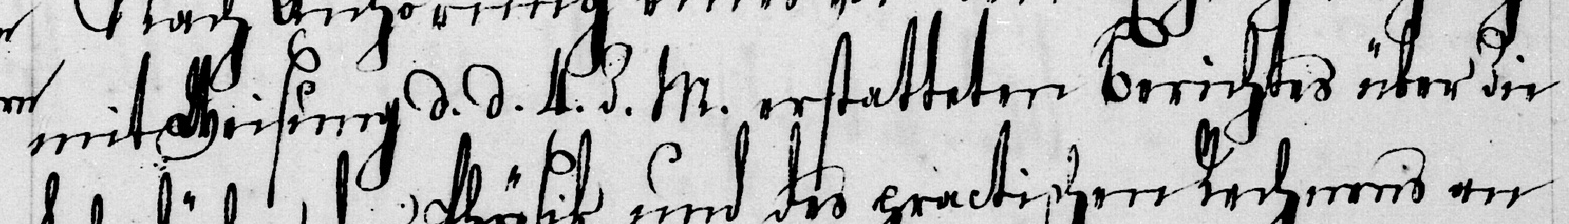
mit Weisung d. d. 4. d. M. erstatteten Berichtes über die
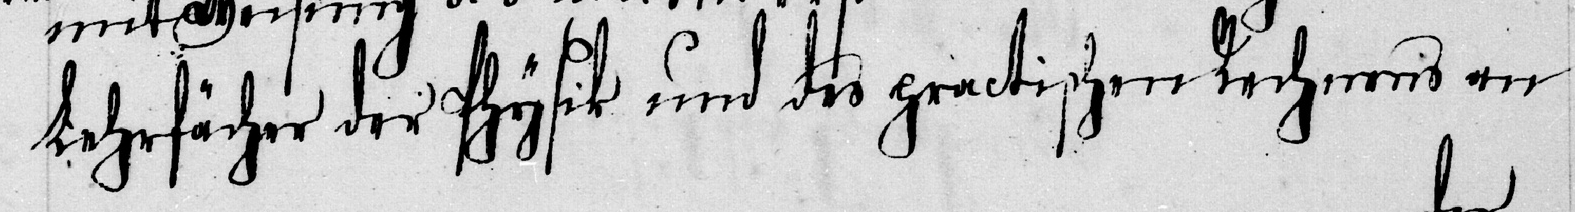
Lehrfächer der Physik und des practischen Rechnens an
